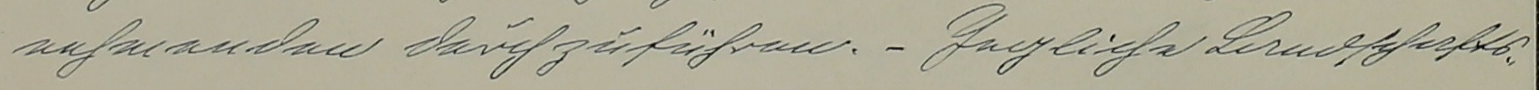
nehmenden durchzuführen. – Jegliche Landschafts-
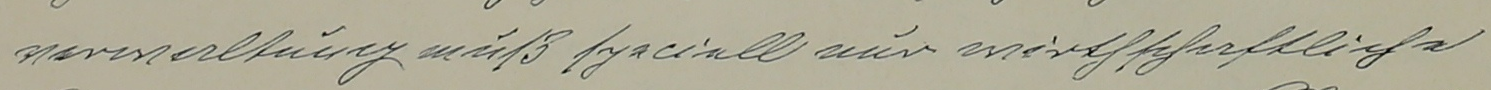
verwaltung muß speciell nur wirthschaftliche
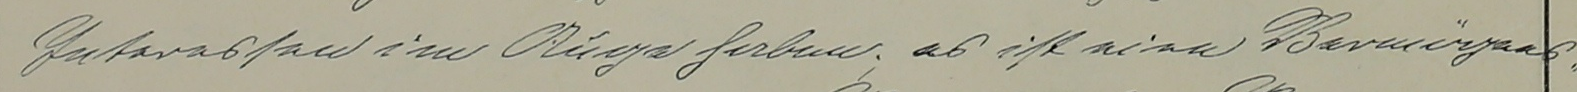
Interessen im Auge haben; es ist eine Vermögens-
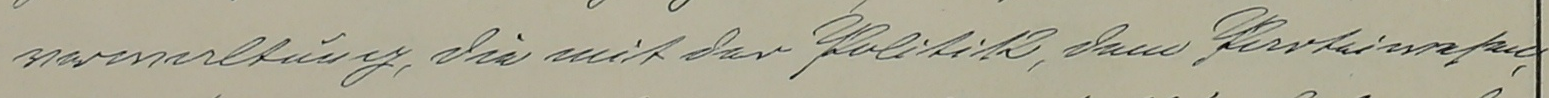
verwaltung, die mit der Politik, dem Parteiwesen,
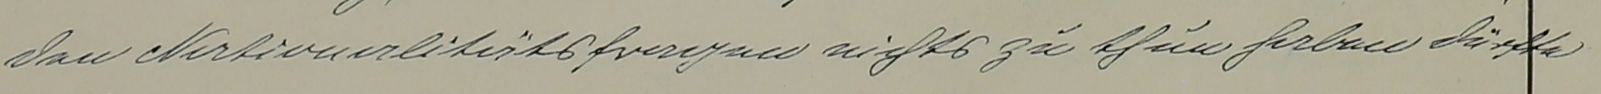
den Nationalitätsfragen nichts zu thun haben dürfte
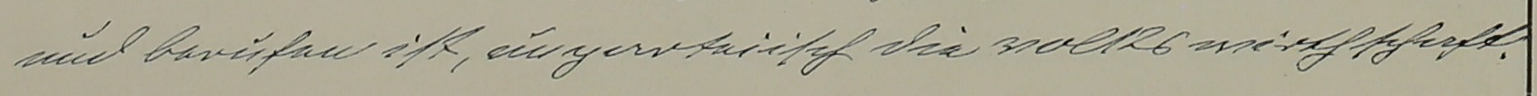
und berufen ist, unparteiisch die volkswirthschaft-
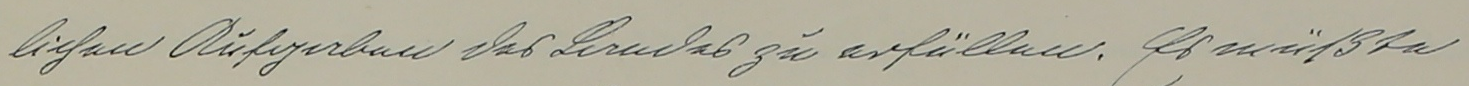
lichen Aufgaben des Landes zu erfüllen. Es müßte
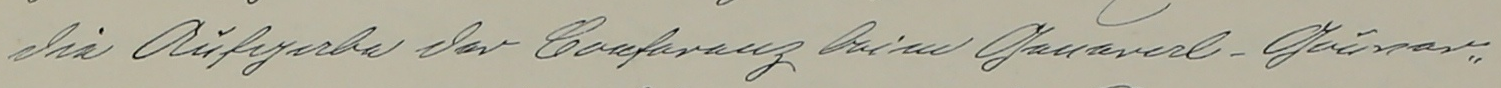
die Aufgabe der Conferenz beim General-Gouver-
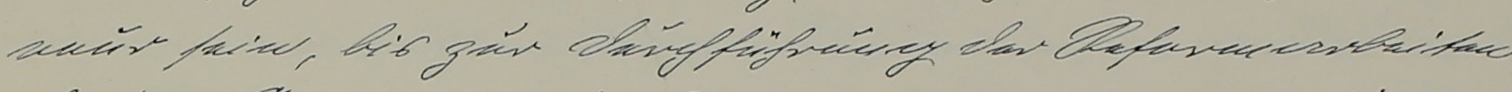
neur sein, bis zur Durchführung der Reformarbeiten
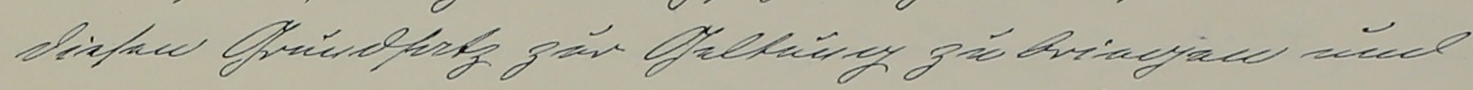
diesen Grundsatz zur Geltung zu bringen und
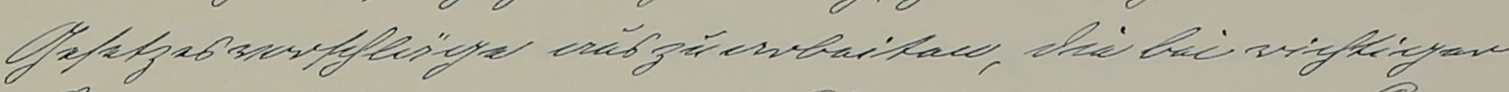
Gesetzesvorschläge auszuarbeiten, die bei richtiger
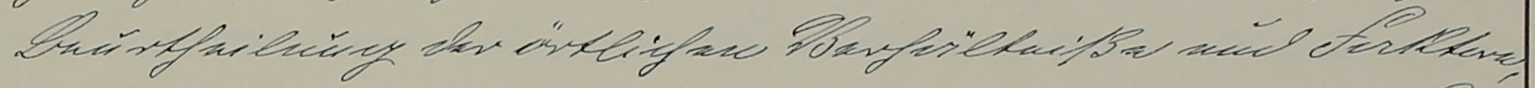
Beurtheilung der örtlichen Verhältniße und Fakten,
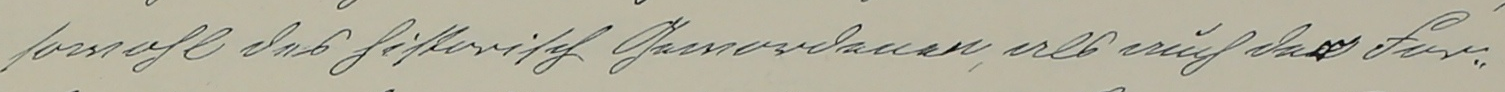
sowohl des historisch Gewordenen als auch der For-
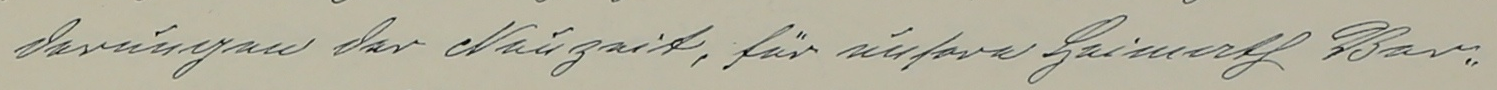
derungen der Neuzeit, für unsere Heimath Ve-
